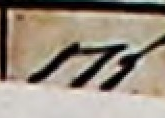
CK.
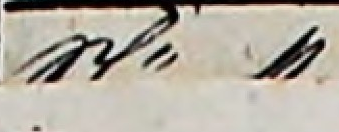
???
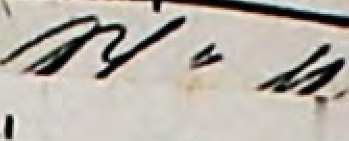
???
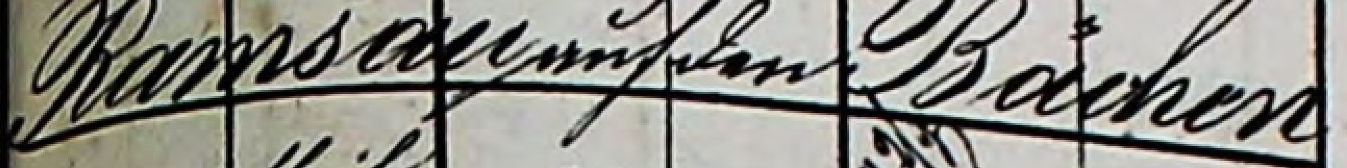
Ramsau auf den Bächen
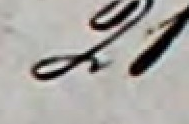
21
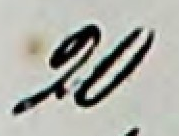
20
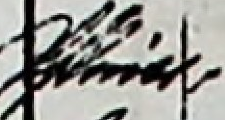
Pflinds
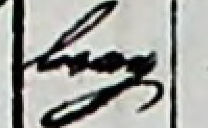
berg
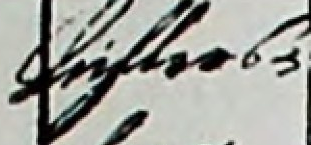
???lers„
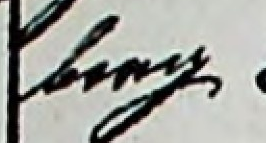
berg
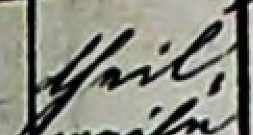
theil„
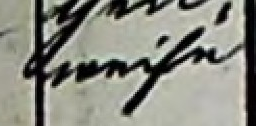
weise
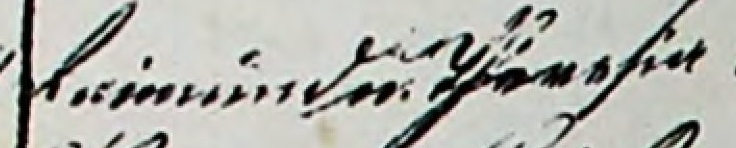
Reimund u. Theresia
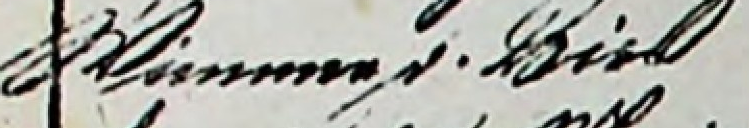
Wimme v. Birs
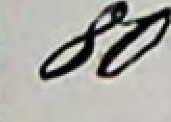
80
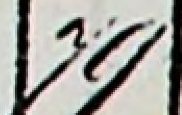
79
